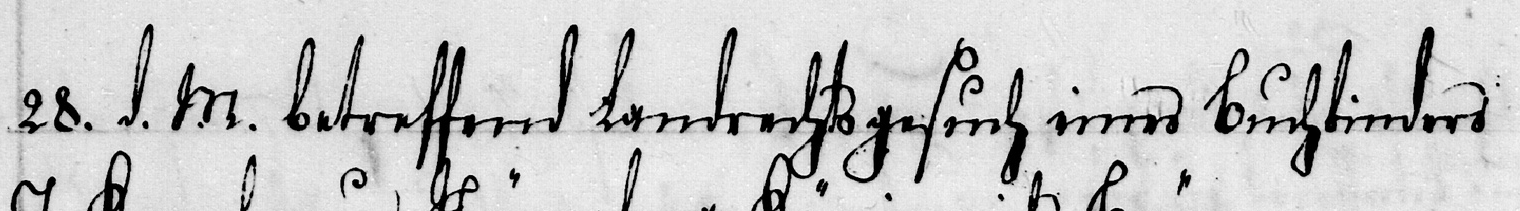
28. d. M. betreffend Landrechtsgesuch eines Buchbinders
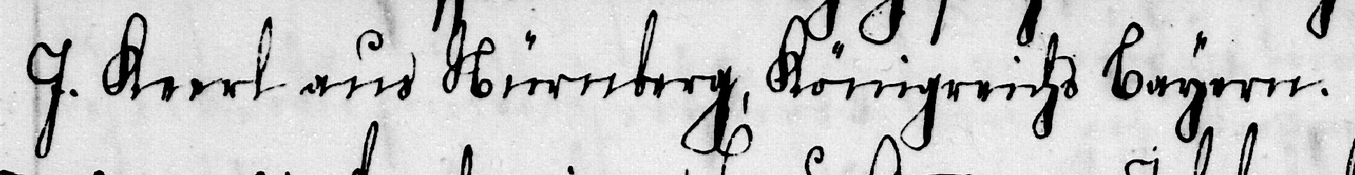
J. Keerl aus Nürnberg, Königreichs Bayern.
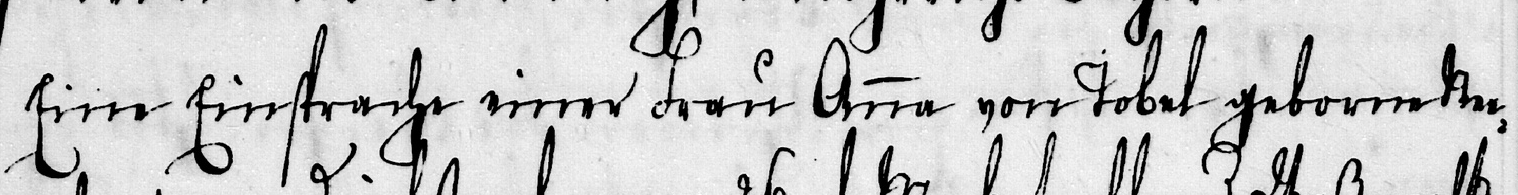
Eine Einsprache einer Frau Anna von Tobel geborene Nee¬
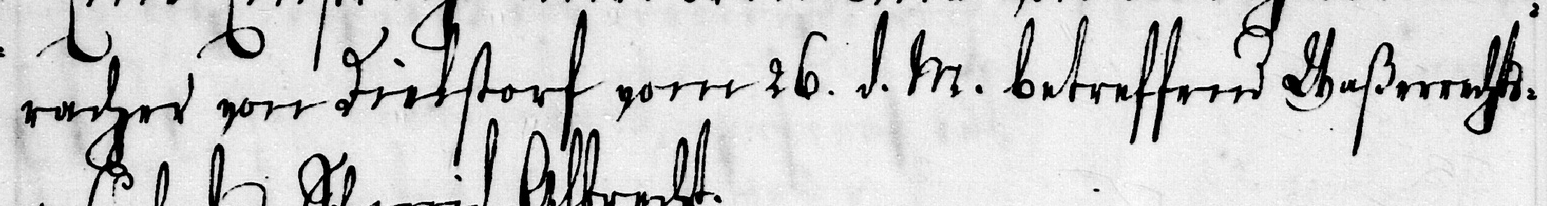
racher von Dielstorf vom 26. d. M. betreffend Waßerrecht¬
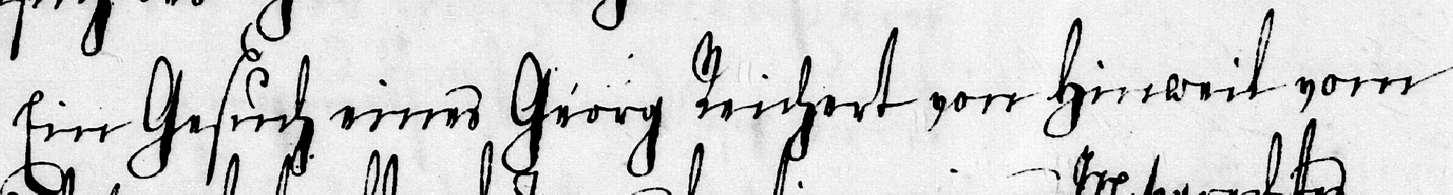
Ein Gesuch eines Georg Reichert von Hinweil vom
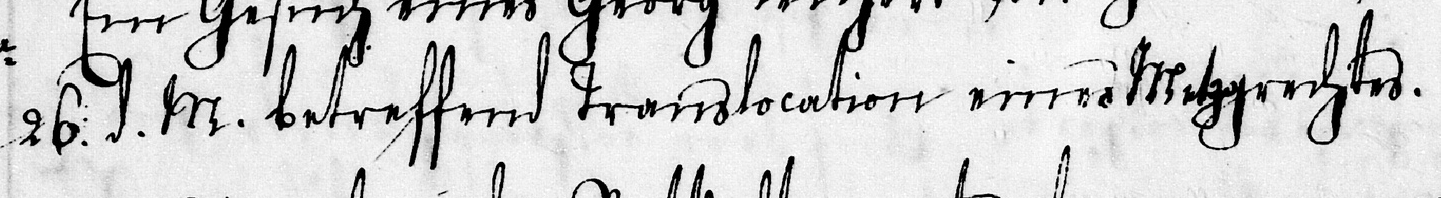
26. d. M. betreffend Translocation eines Metzgrechtes.
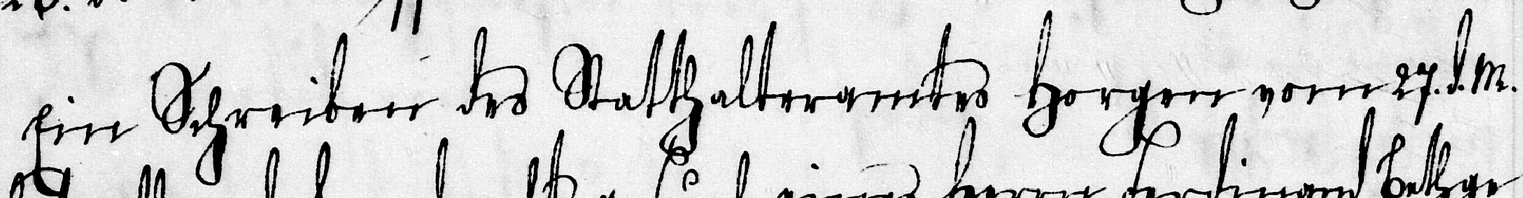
Ein Schreiben des Statthalteramtes Horgen vom 27. d. M.
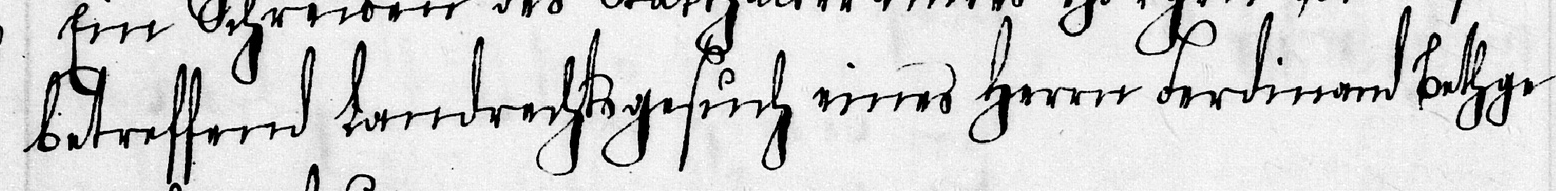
betreffend Landrechtsgesuch eines Herrn Ferdinand Bethge
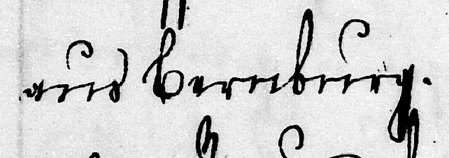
aus Bernburg.
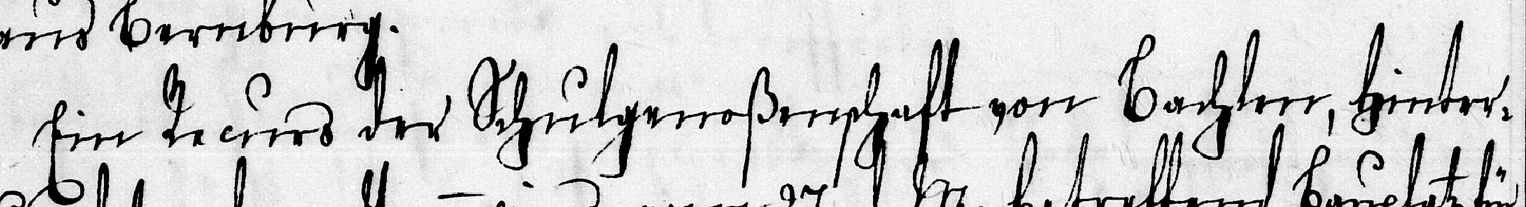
Ein Recurs der Schulgenoßenschaft von Bachlen, Hinter-
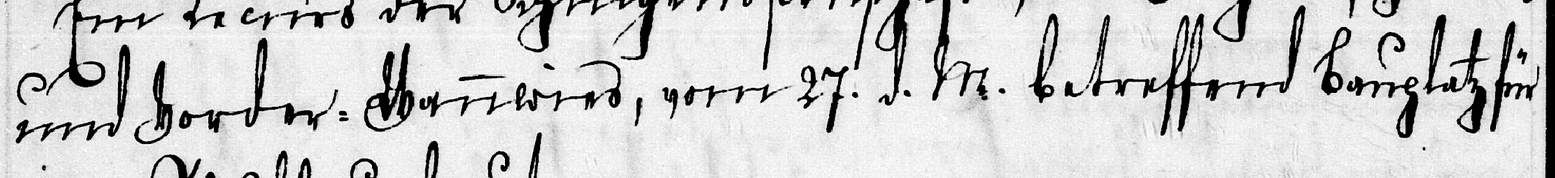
und Vorder-Wannwies, vom 27. d. M. betreffend Bauplatz für
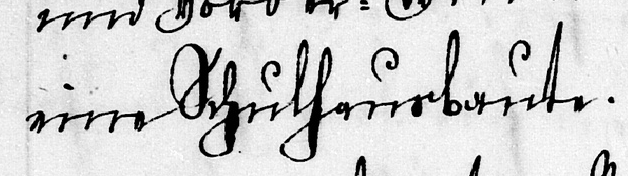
eine Schulhausbaute.
